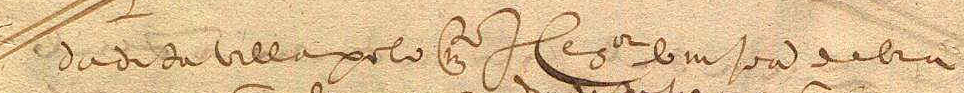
da dita villa pelo mto Jle sor dom Joā de bra
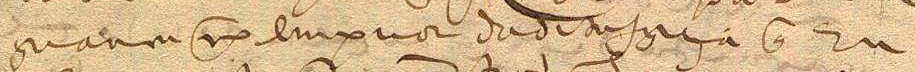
guança c̄ꝭ dom prior da dita Jgreja q̄ Eu
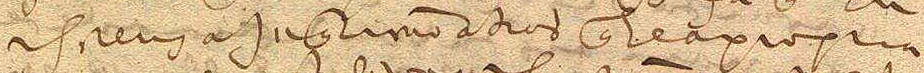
escreuj a Jnq̄rição atras q̄ he a propria
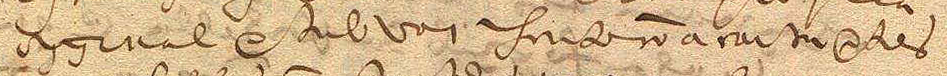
orjginal e tudo vaj escrito cō a carta ē tres
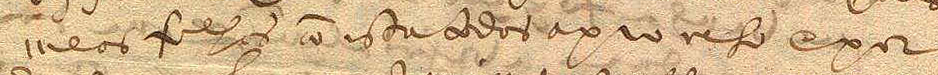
meas folhas cō esta todas a proceso e por
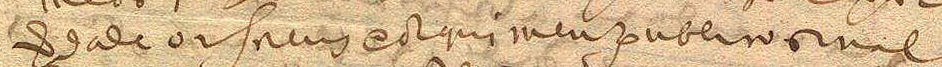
ꝟdade o escreuj e Aqui meu publico sinal
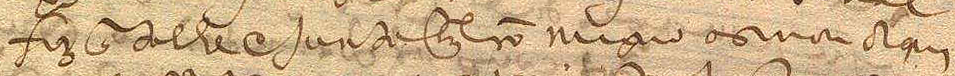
fiz q̄ tal he e Juntamte cōmiguo asinou Aquj
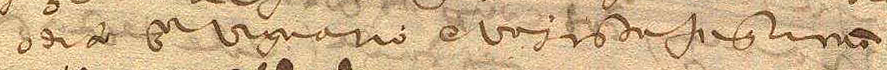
o dito sor viguairo e vaj esta Jnq̄rição
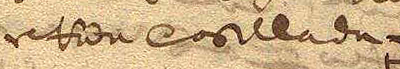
ceRada e asellada
